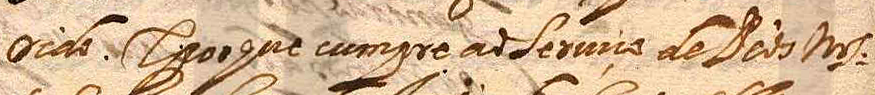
rido. E porque cumpre ao Seruiço de Deos nos
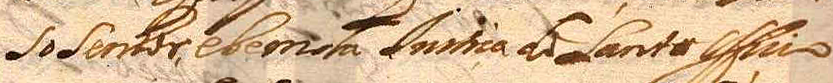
so Senhor, e bem da Iustiça do Santo Offiçio
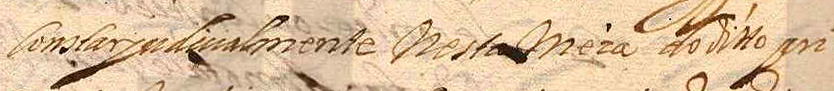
Constar judicialmente nesta meza do ditto pri
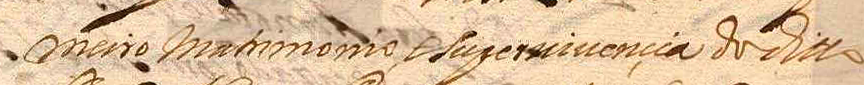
meiro Matrimonio, e superuiuençia do ditto
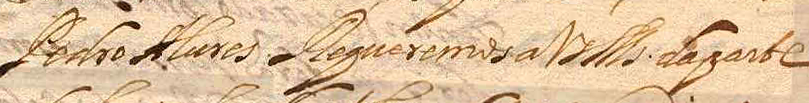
Pedro Alures Requeremos a Vs Ills. da parte
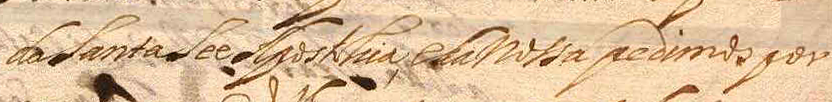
da Santa see apostolica, e da nossa pedimos por
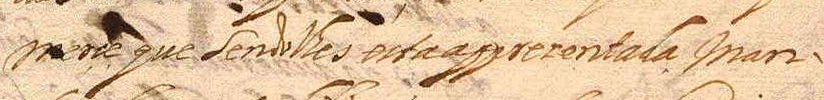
merçe que sendolhes esta apprezentada, man
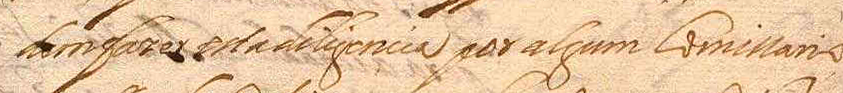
dem fazer esta diligencia por algum Comissario
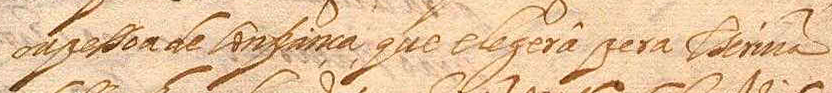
ou pessoa de confiança, que elegera pera Escriuaõ
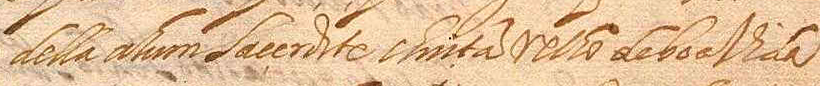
della a hum Sacerdote christaõ velho de boa Vida
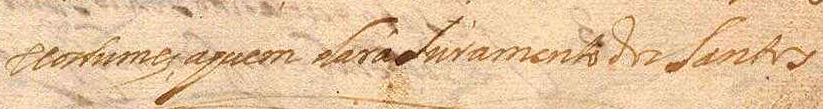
e costumes, a quem dará Iuramento dos Santos
